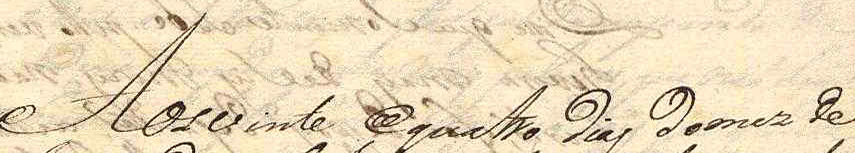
Aoz vinte e quatro dias do mez de
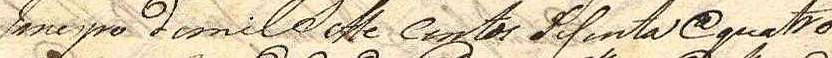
Janeyro de mil Settecentos Sesenta e quatro
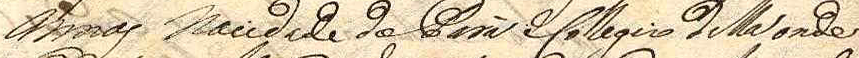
annos na cidade do Pará e Collegio della onde
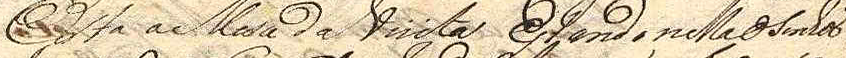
Esta a Mesa da Vizita Estando nella O senhor
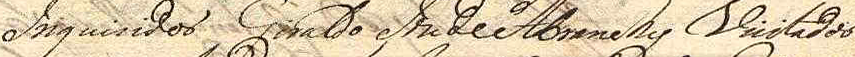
Inquizidor Giraldo Joze de Abranches Vizitador
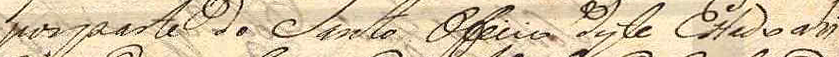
por parte do Santo Officio deste Estado ahi
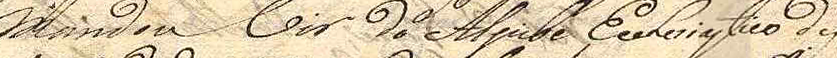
mandou Uir do Aljube EccLesiastico des
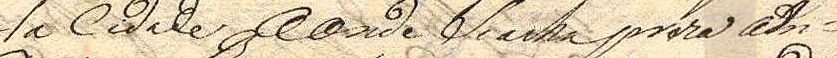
ta Cidade aonde Se acha preza a In
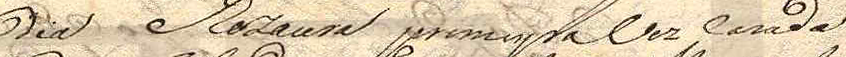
dia Rozaura primeyra vez cazada
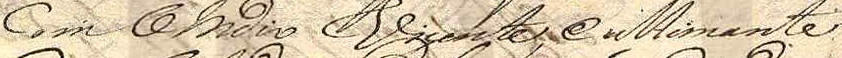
Com O Indio Vicente, e ultimante
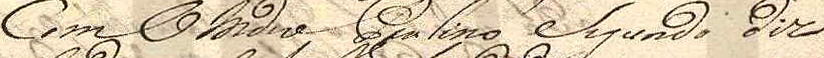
Com O Indio Paulino Segundo diz
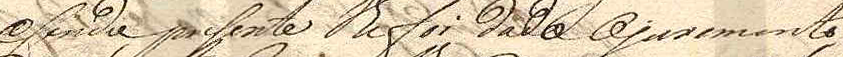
e sendo presente lhe foi dado O juramento
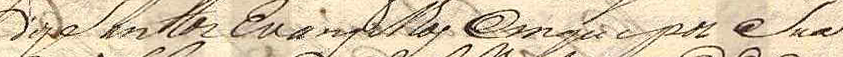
dos Santos Euangelhos em que poz Sua
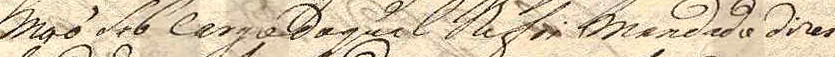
maõ sob cargo do qual lhe foi mandado dizer
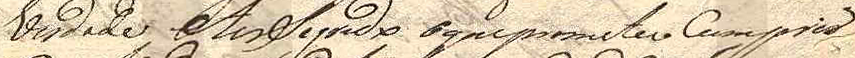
Verdade e ter Segredo o que prometeo Cumprir
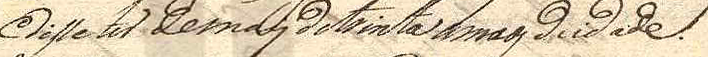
e disse ter de mais de trinta annos de idade.
